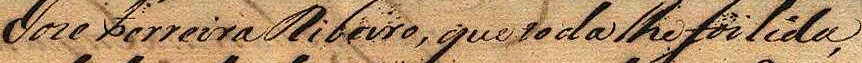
Ioze Ferreira Ribeiro, que toda lhe foi lida,
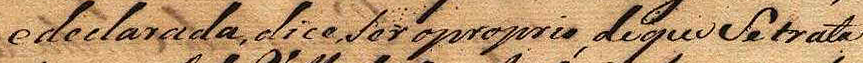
e declarada, dice, ser o proprio, de que Se trata
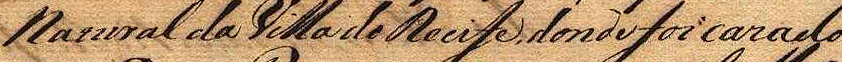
Natural da Villa de Recife, donde foi cazado
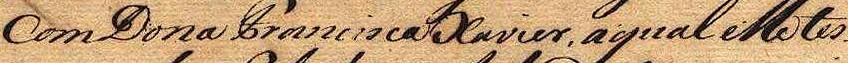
com Dona Francisca Xavier, a qual elle tes
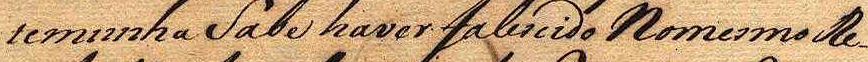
temunha Sabe haver falecido No mesmo Re
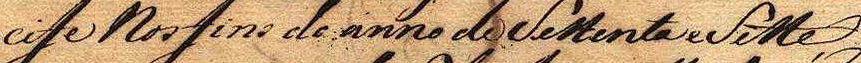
cife Nos fins do anno de Sttenta e Sette
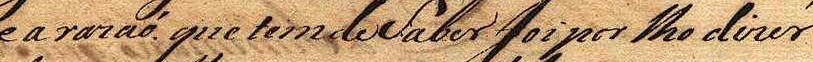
e a razaõ que tem de Saber foi por lho dizer
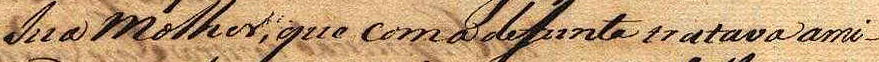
Sua Molher que com a defunta tratava ami
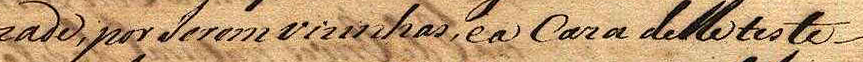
zade, por Serem vizinhas, e a caza delle teste
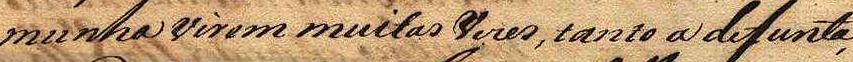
munha virem muitas vezes, tanto a defunta
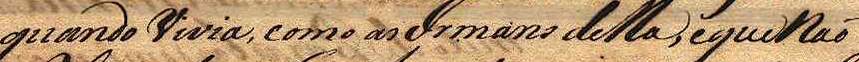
quando Vivia, como as Irmans della, e que Não
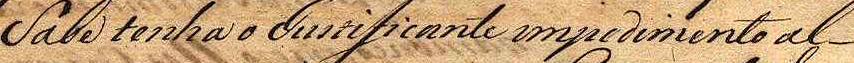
Sabe tenha o Iustificante impedimento al
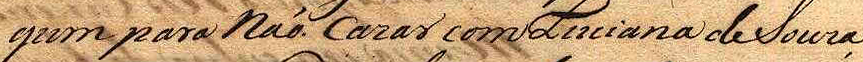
gum para Não. cazar com Luciana de Souza
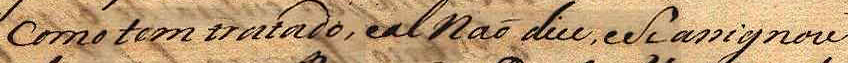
como tem tratado, e al Não dice e Se assignou
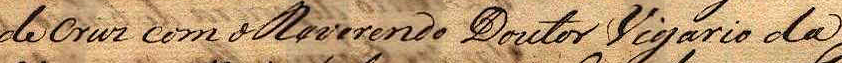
de Cruz com o Reverendo Doutor Vigario da
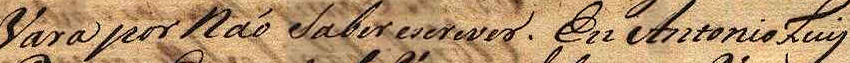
Vara por Não Saber escrever. Eu Antonio Luis
